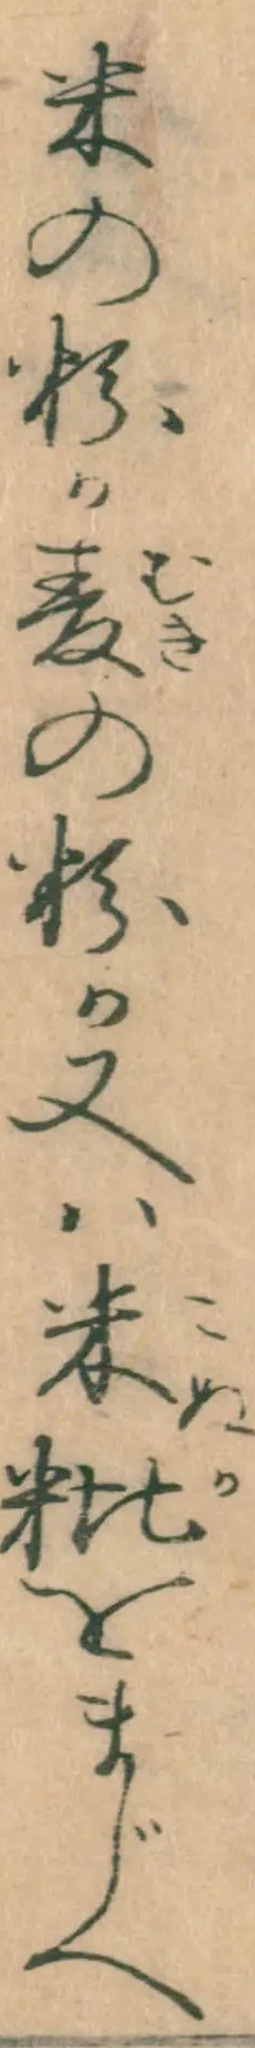米の粉か麦の粉か又は米粃をまじへ
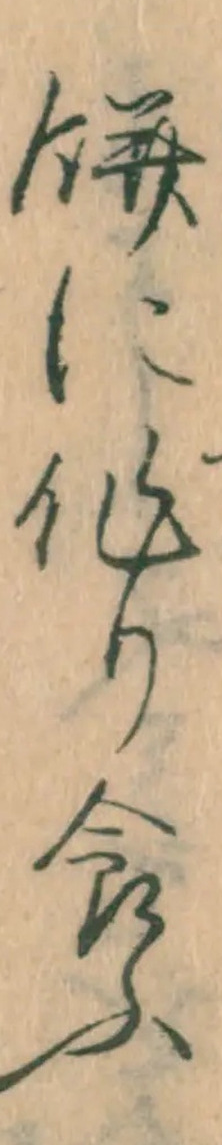餅に作り食ふ
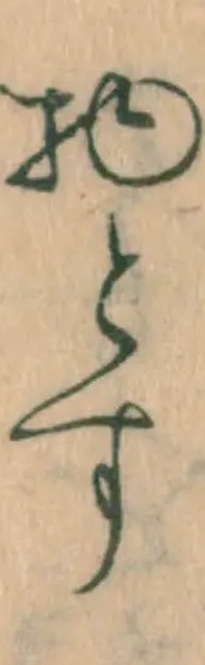物とす
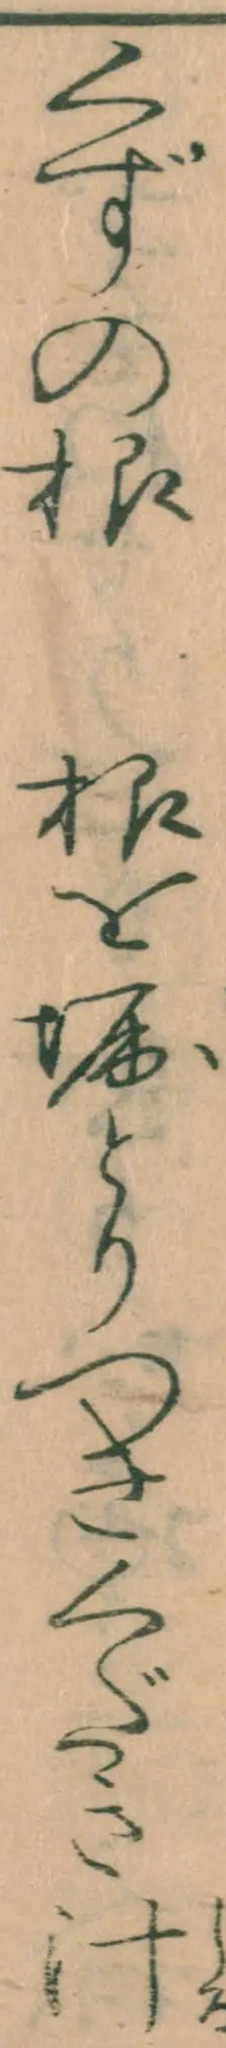くずの根根を堀とりつきくだき汁
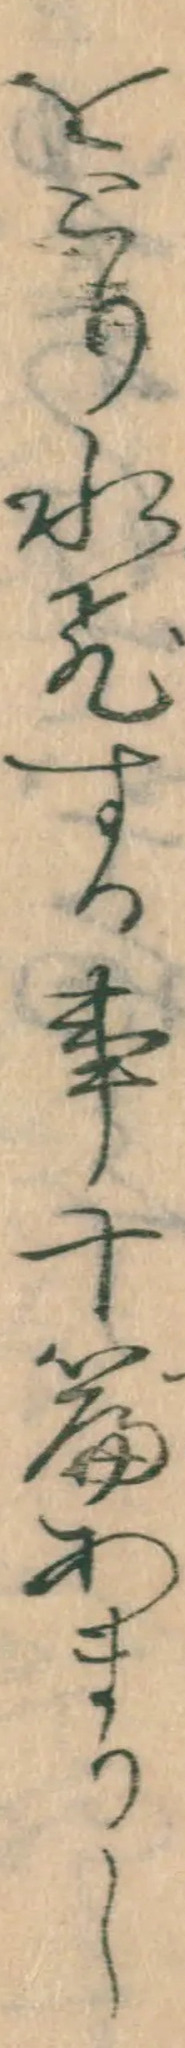をとり水飛する事十篇あまりし
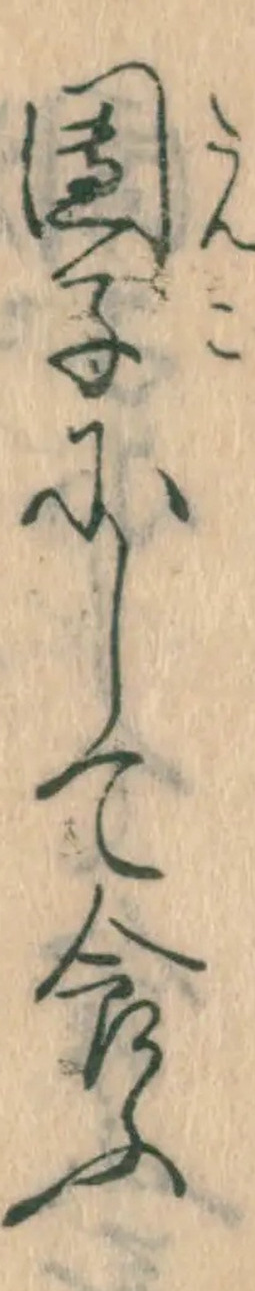団子にして食ふ
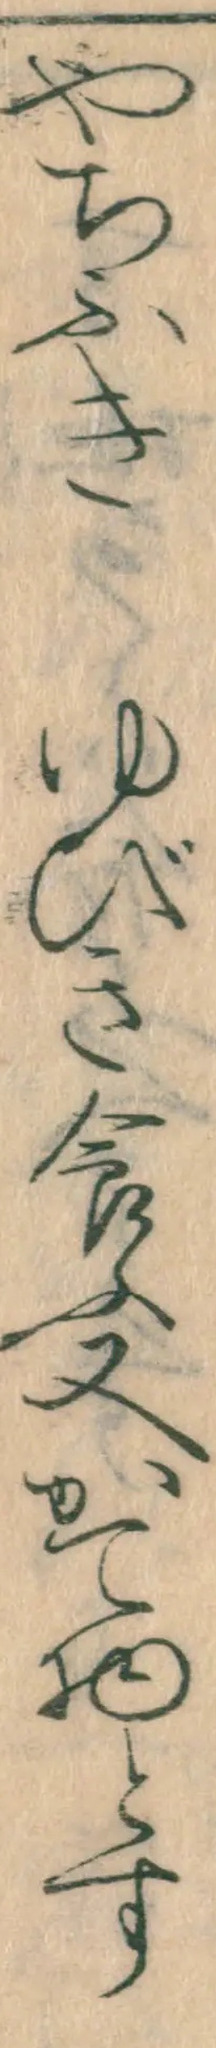やちふきゆびき食ふ又かて物とす
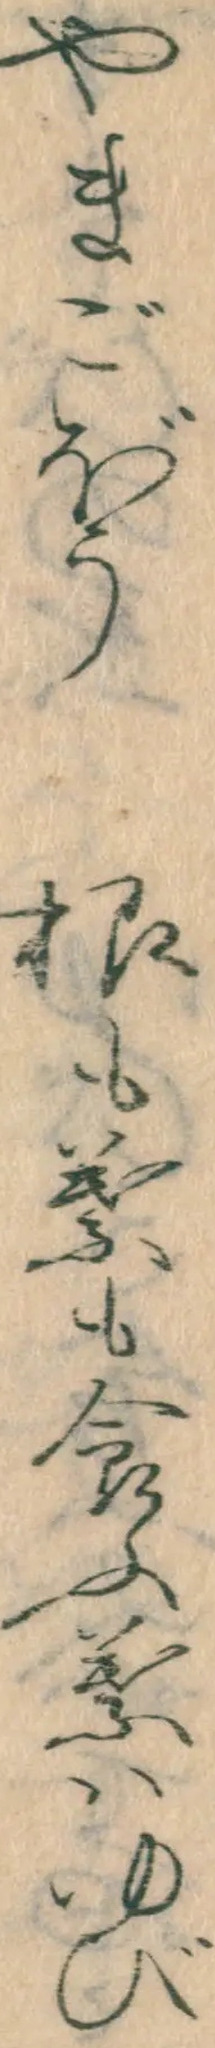やまごぼう根も葉も食ふ葉はゆび
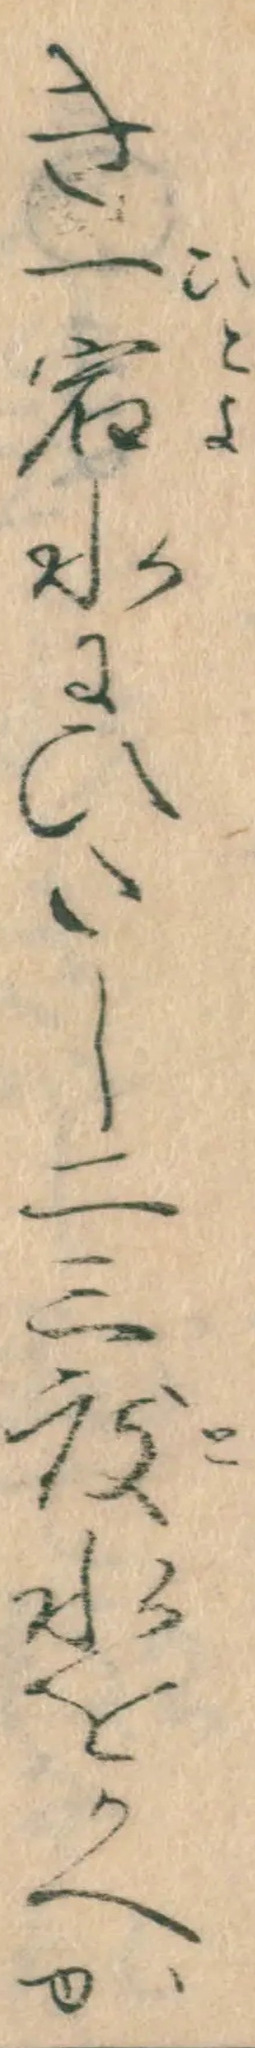き一宿水にひたし二三度水をかへか
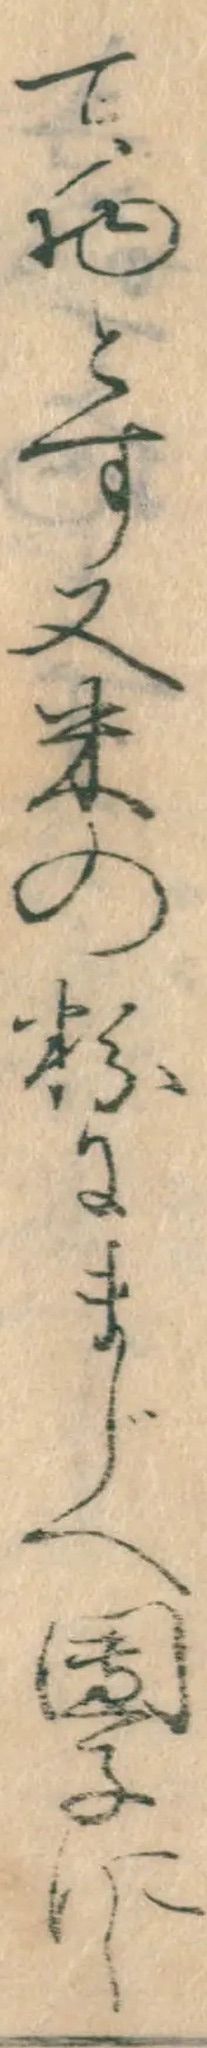て物とす又米の粉にまじへ団子にし
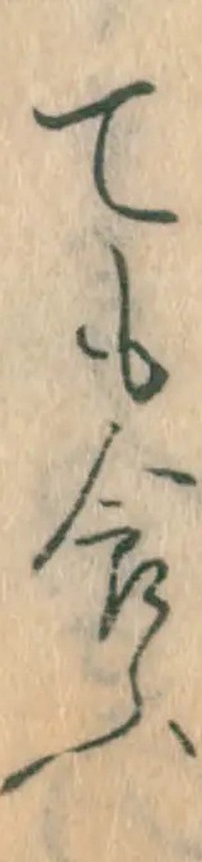ても食ふ

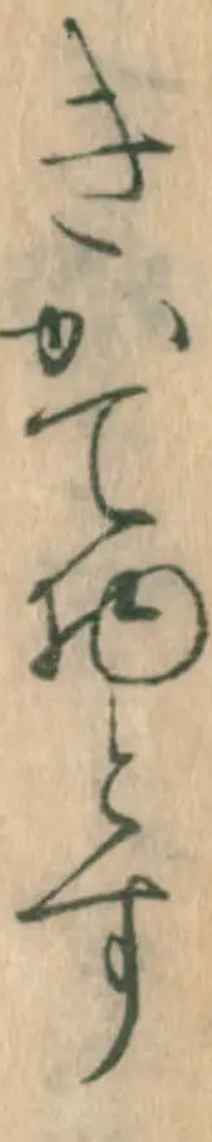きかて物とす
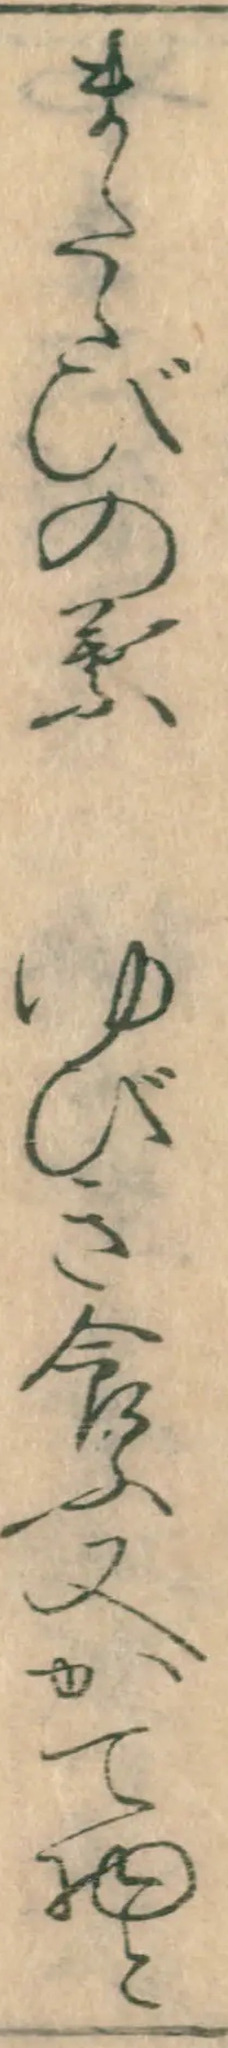またゝびの葉ゆびき食ふ又かて物と
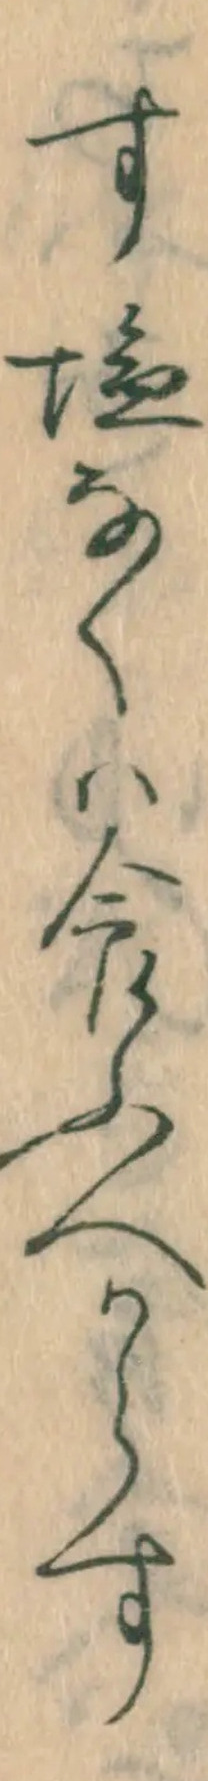す塩なくは食ふへからす
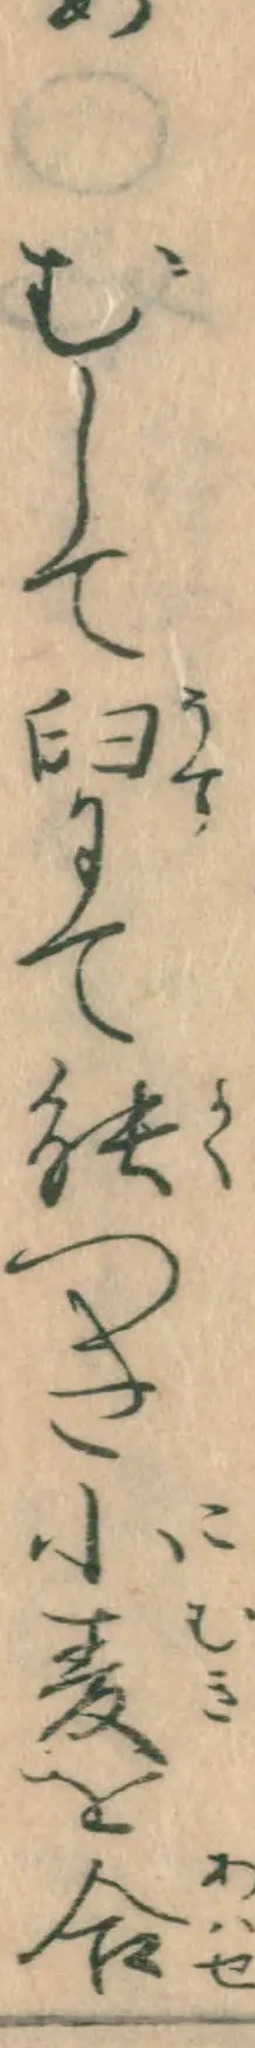まめむして臼にて能つき小麦を合
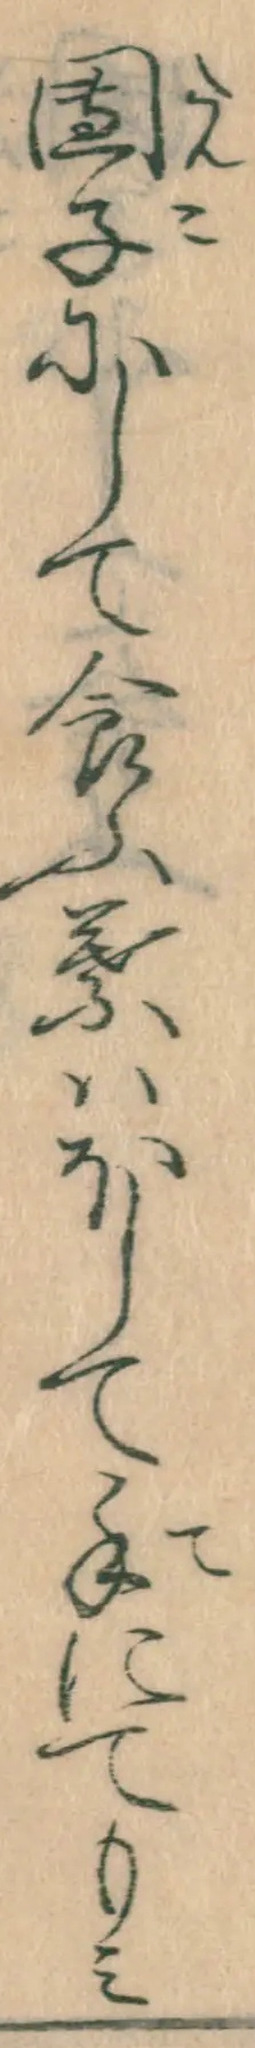団子にして食ふ葉はほして手にてもみ
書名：かてもの
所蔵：国立国会図書館 National Diet Library, JAPAN
